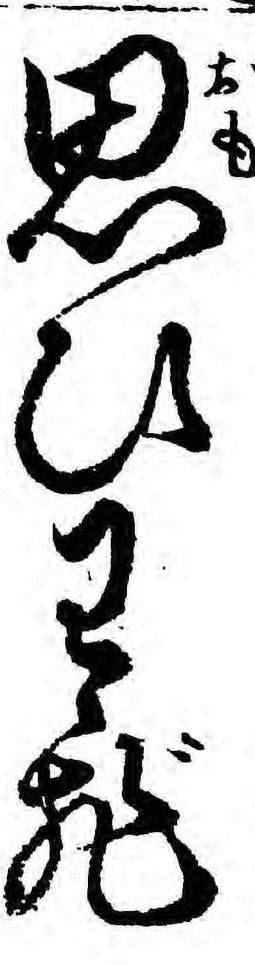思ひわび
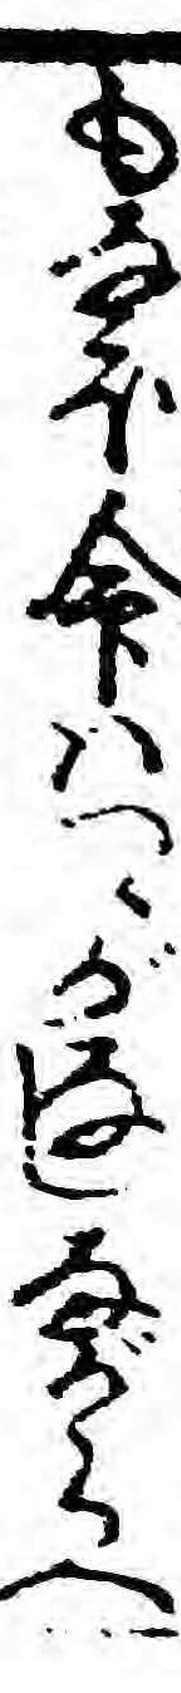もなほ命はつゝがなしながらへ
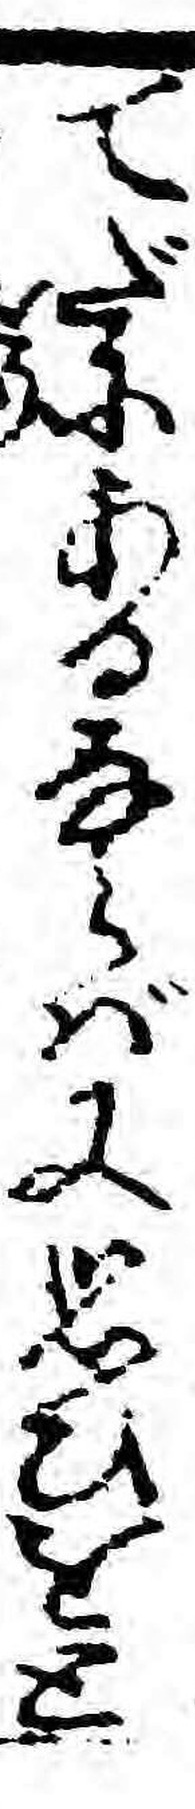てだにあるならば又おもひをと
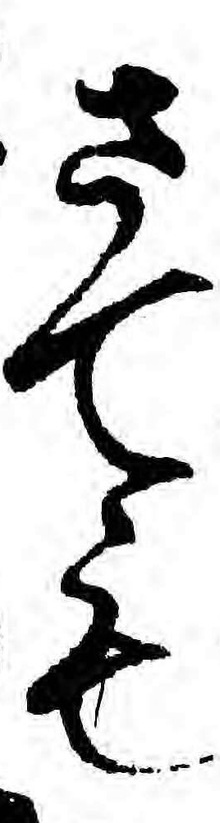さても
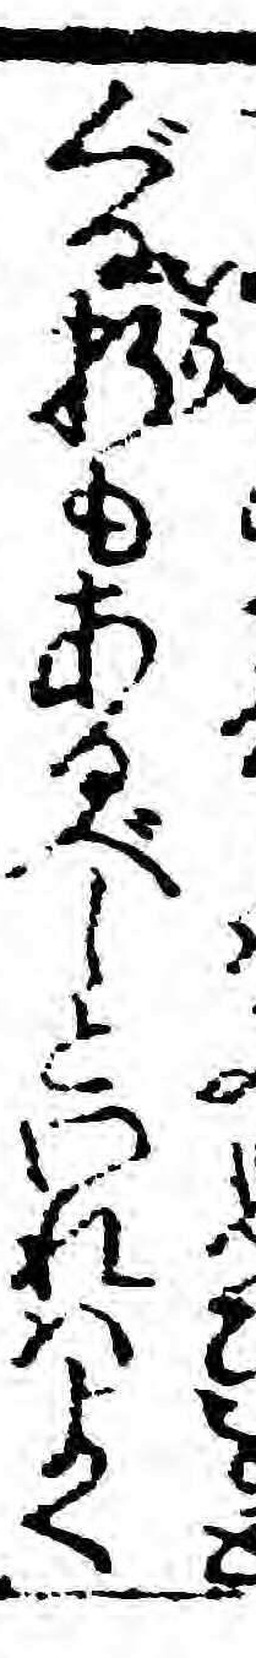ぐる折もあるべしとわれはよく
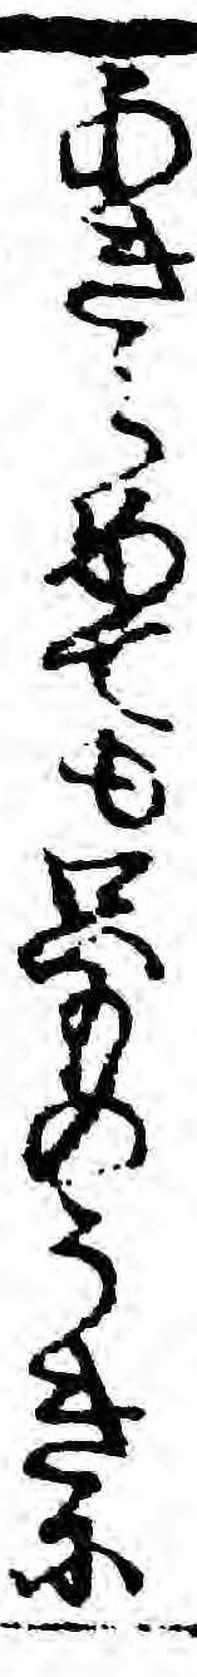あきらめても只ものうきに
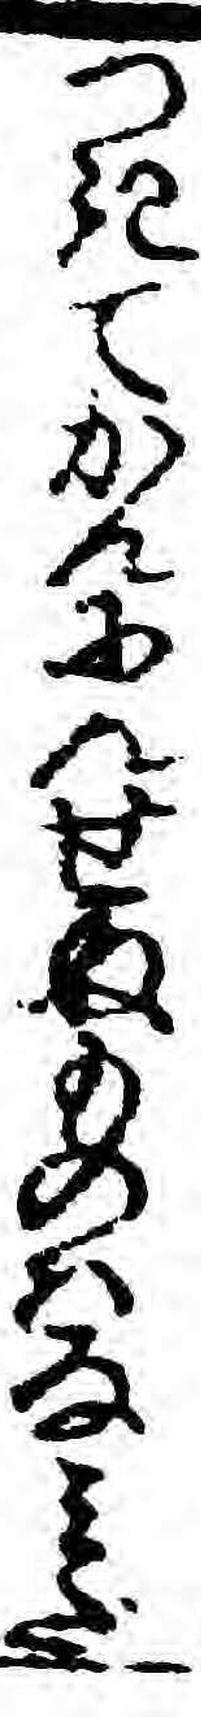つきてかんにんせぬものはなみだ
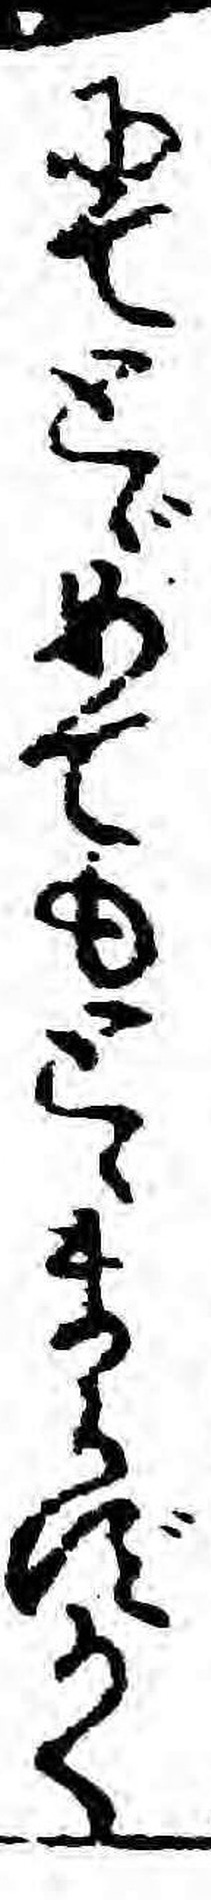にてとゞめてもとゝまらずかく
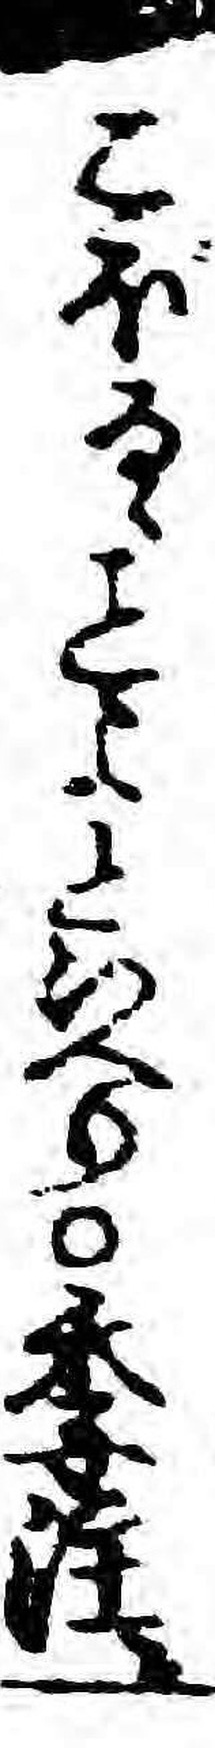こぼるゝことよといへり〇季注に
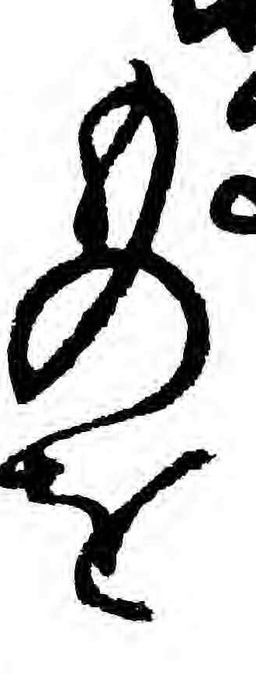ものを
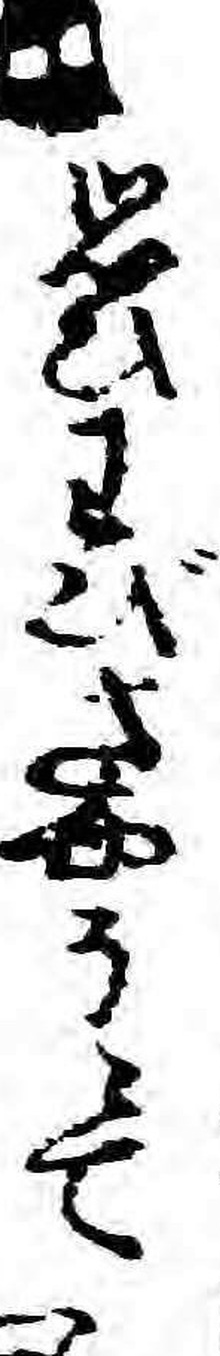思ひわびさやうにて
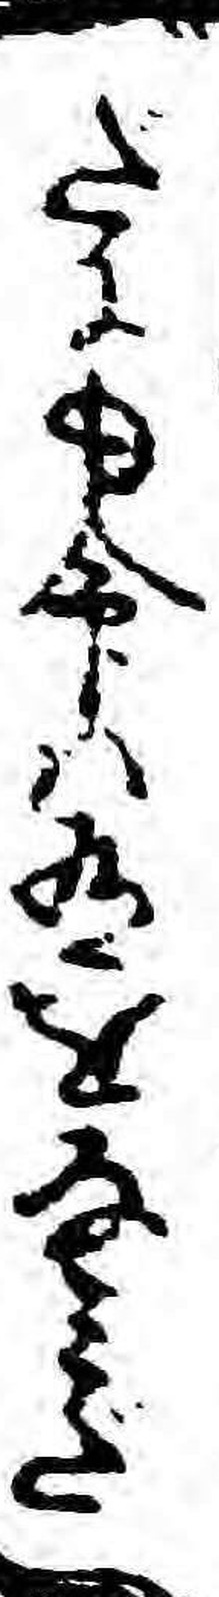だにも命は有をなみだ
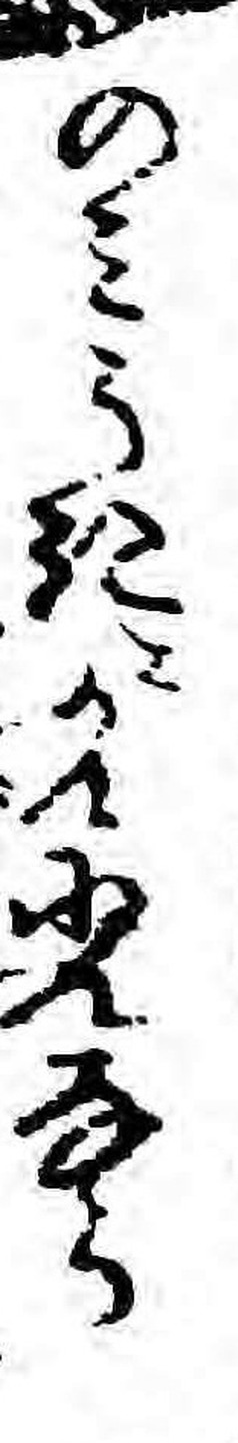のみうきにかんにんなら
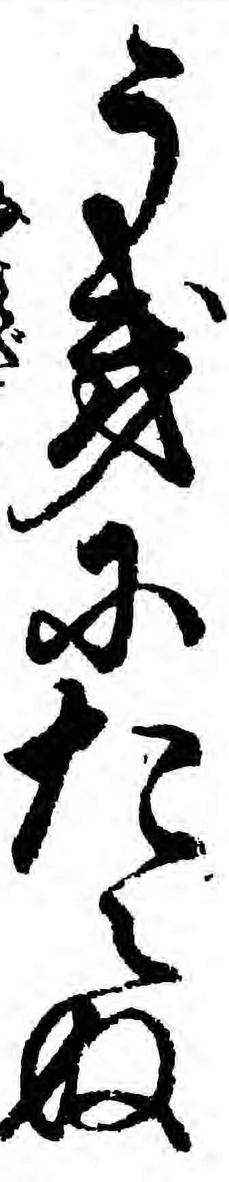うきにたえぬは
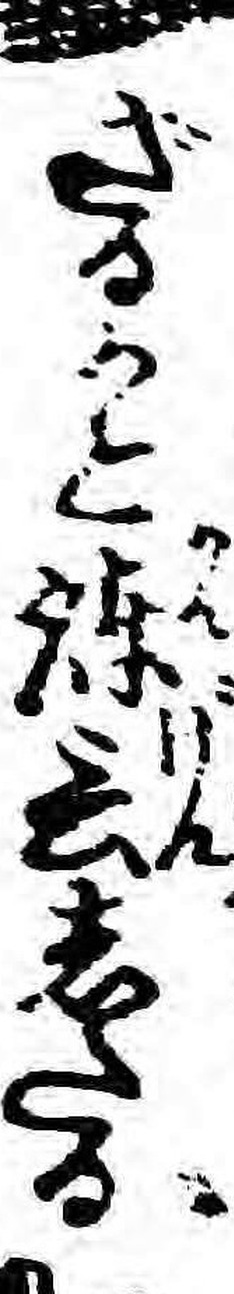ざるかと諫言したる
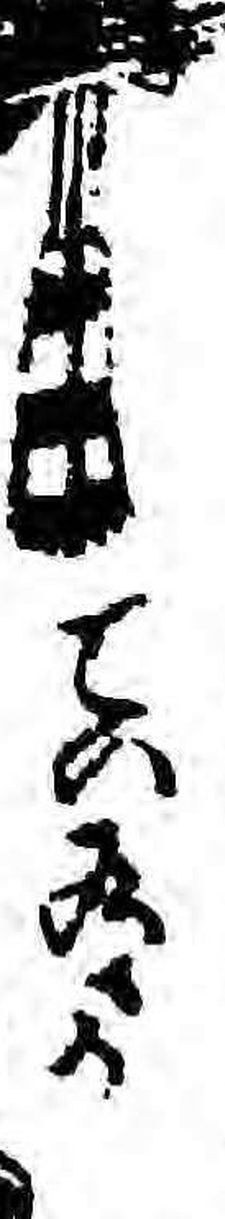てい有か
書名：頭書和歌注譯／壽賀多百人一首小倉錦
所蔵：国文学研究資料館
